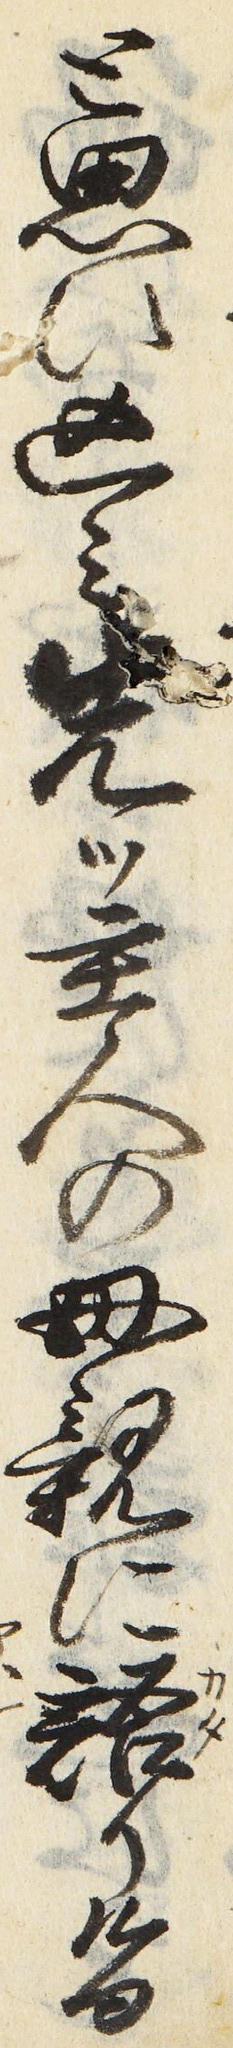と思ひ込み先ツ主人の母親に語りける
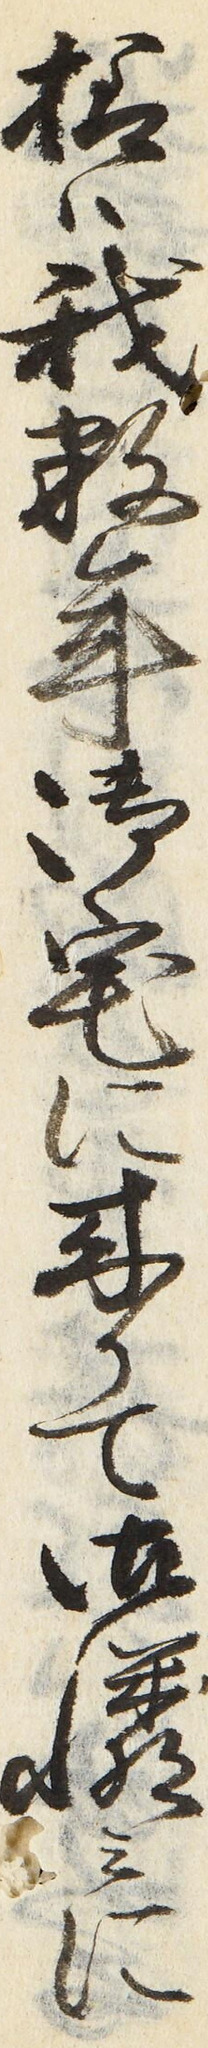様は我数年御宅に来りて御憐みに
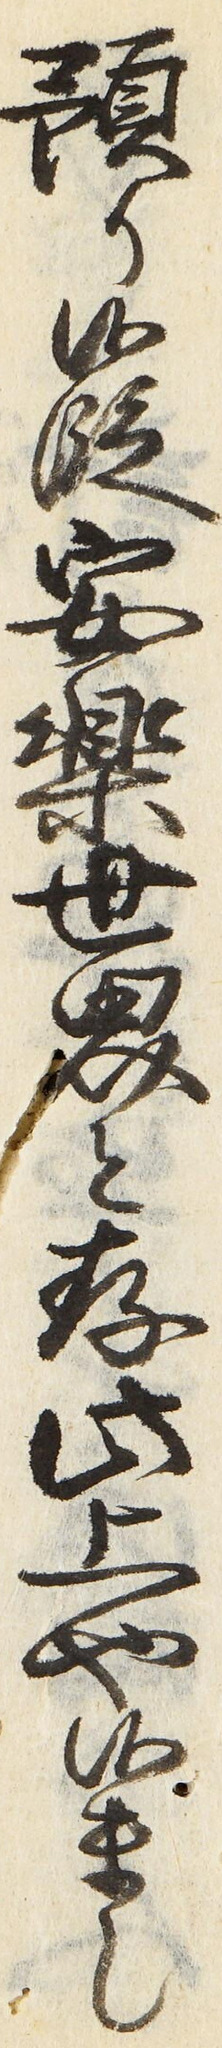預り候段安楽世界と存此上や候まし
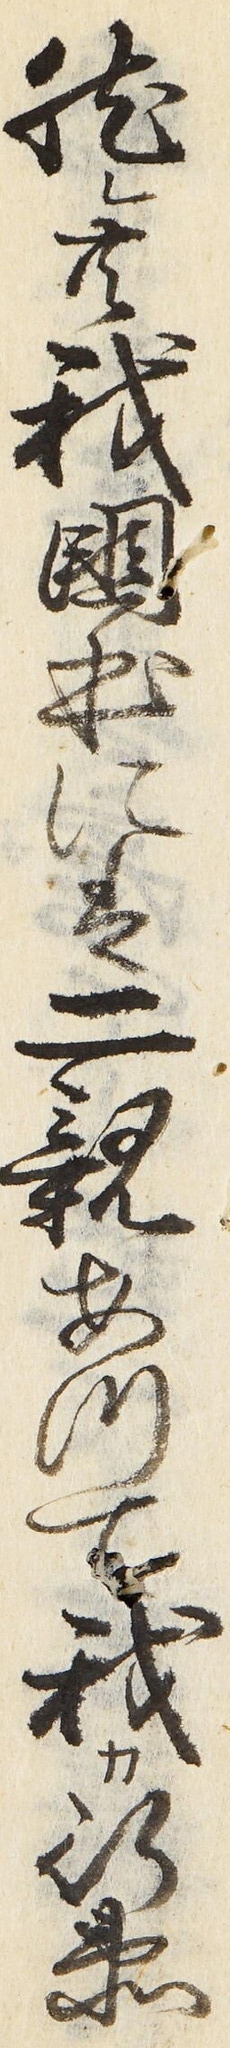然れ共我国本には二親あつて我か行え
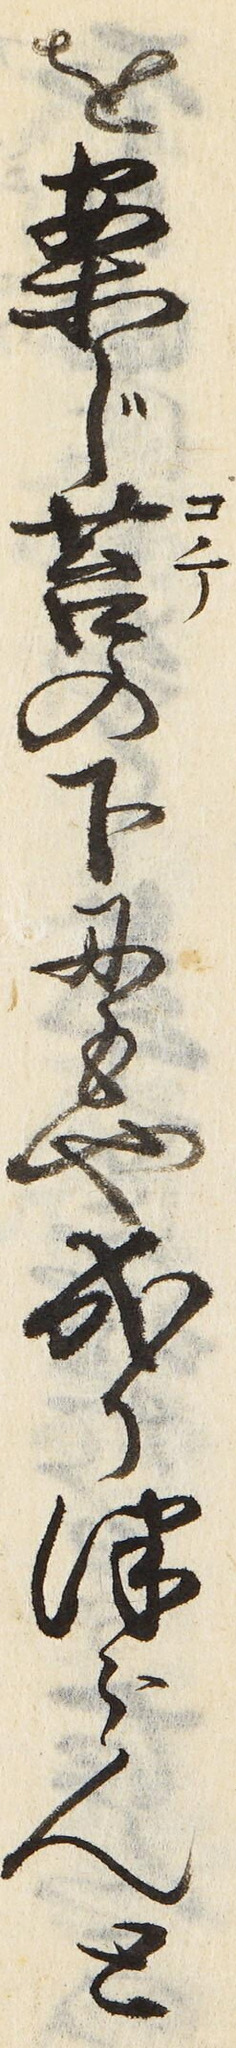を案じ苔の下にもや成りつらんと
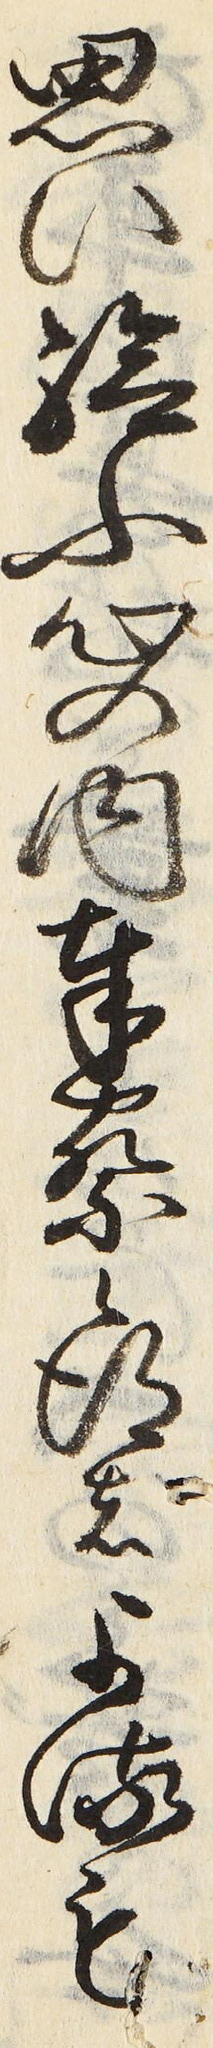思ひ給ふ心の内奉察候得はよるも
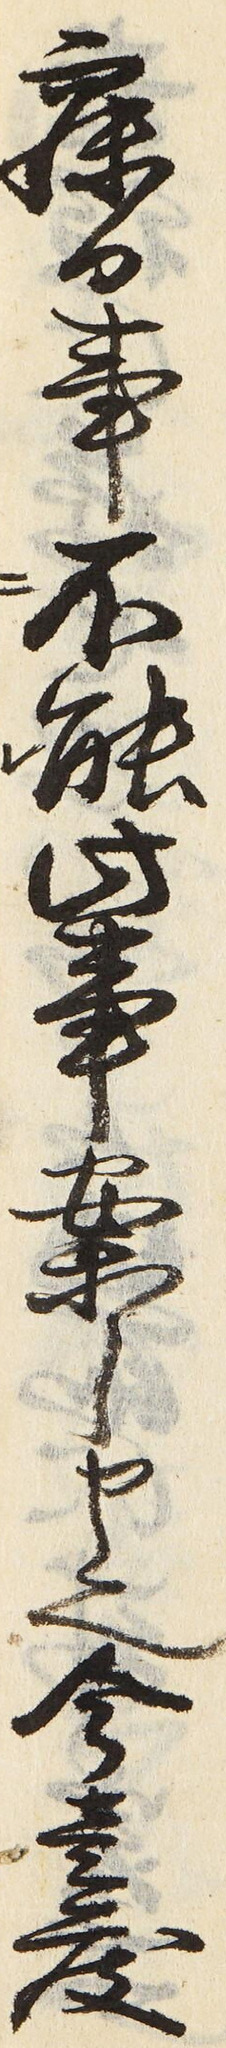寝る事不能此事案し申也今壱度
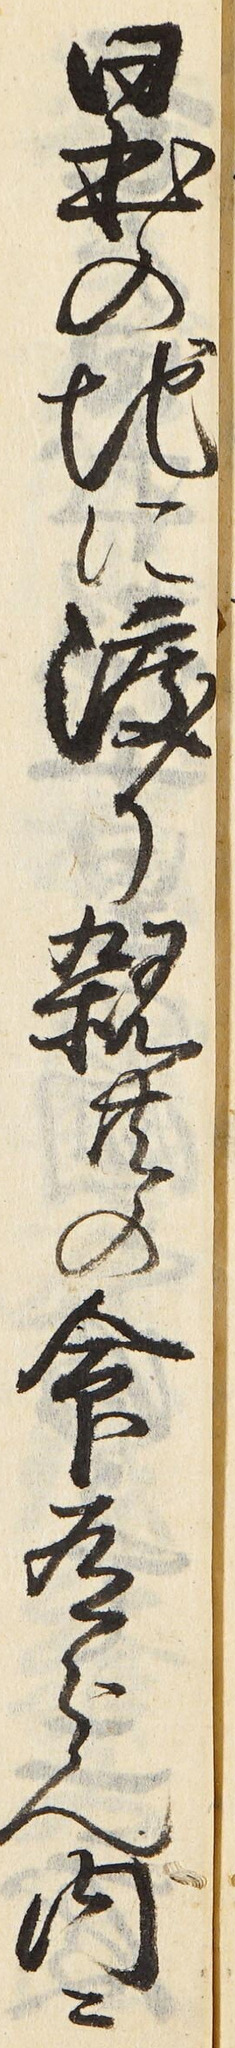日本の地に渡り親共の命有らん内に
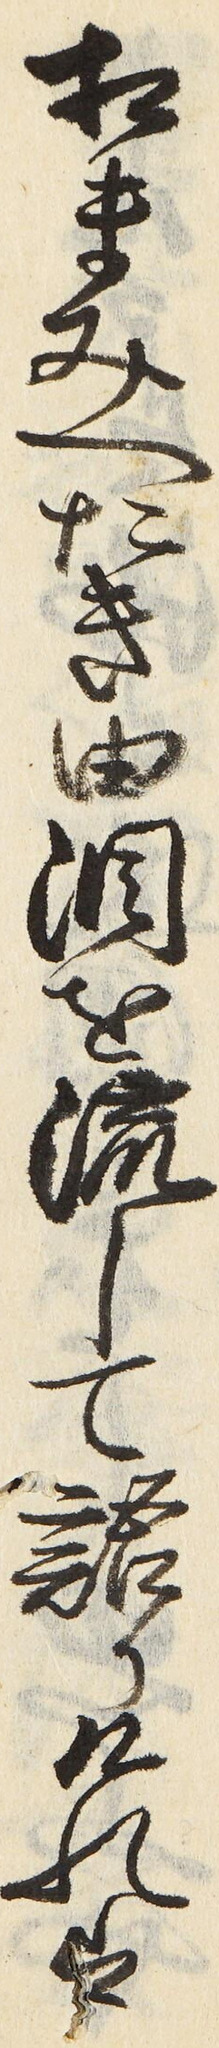相まみへたき由泪を流して語りけれは
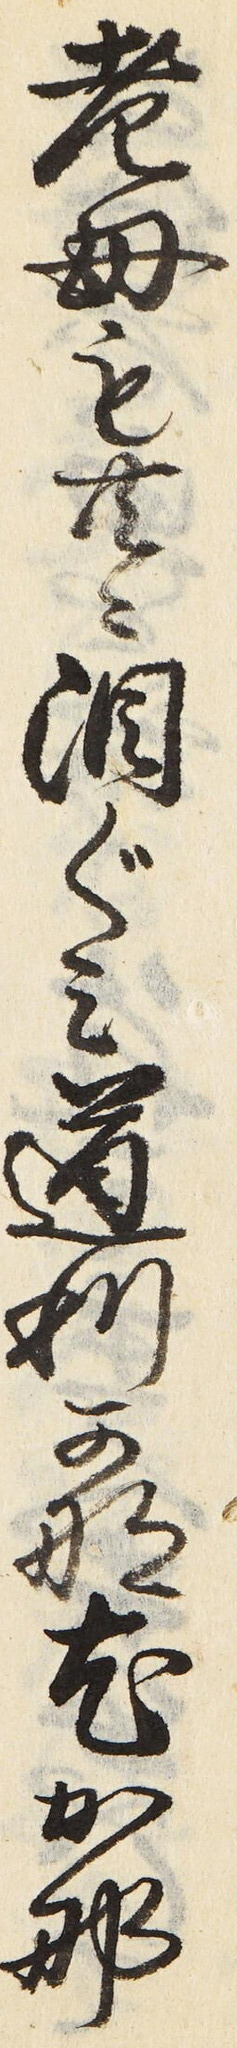老母も共に泪ぐみ道利かな尤かな
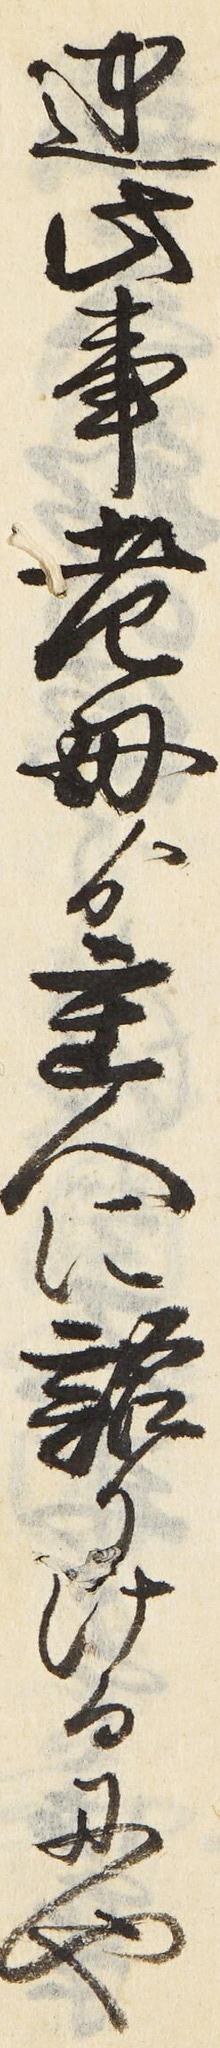迚此事老母ゟ主人に語りけるにや
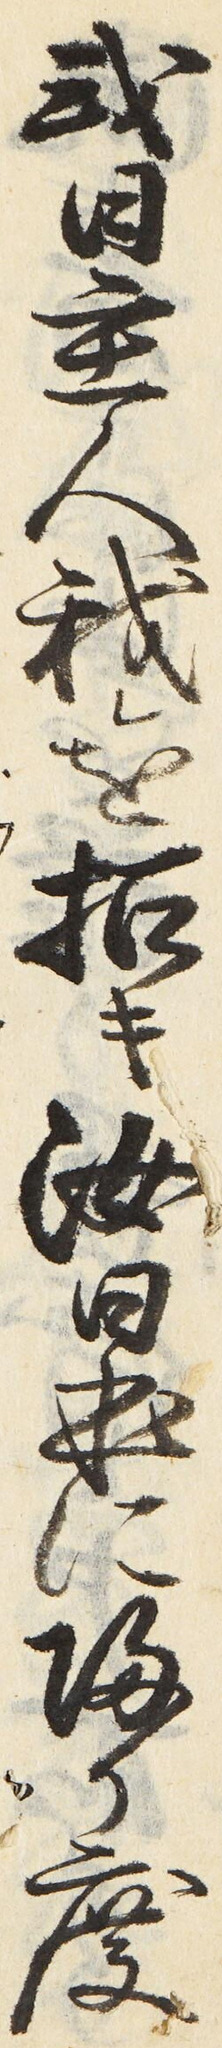或日主人我れを招き汝日本に帰り度
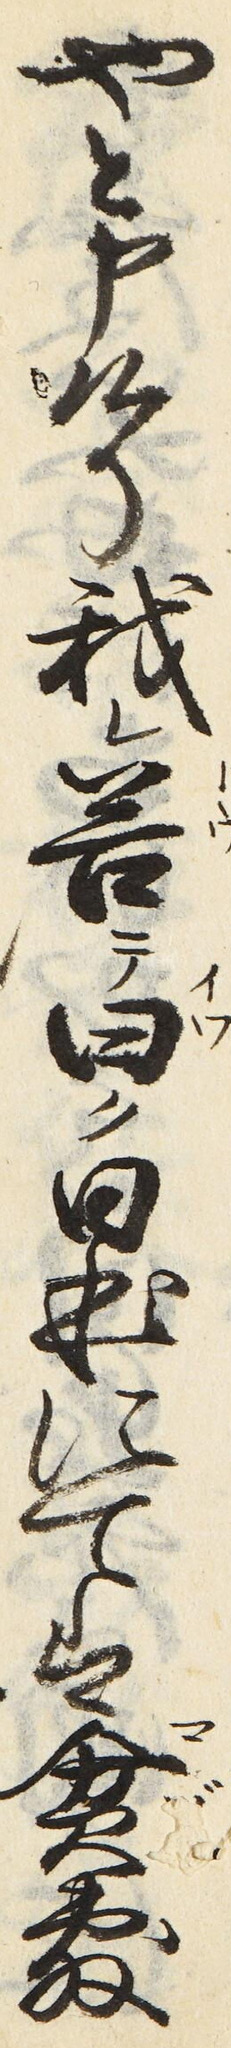やと申けり我れ答て曰く日本にては貧敷
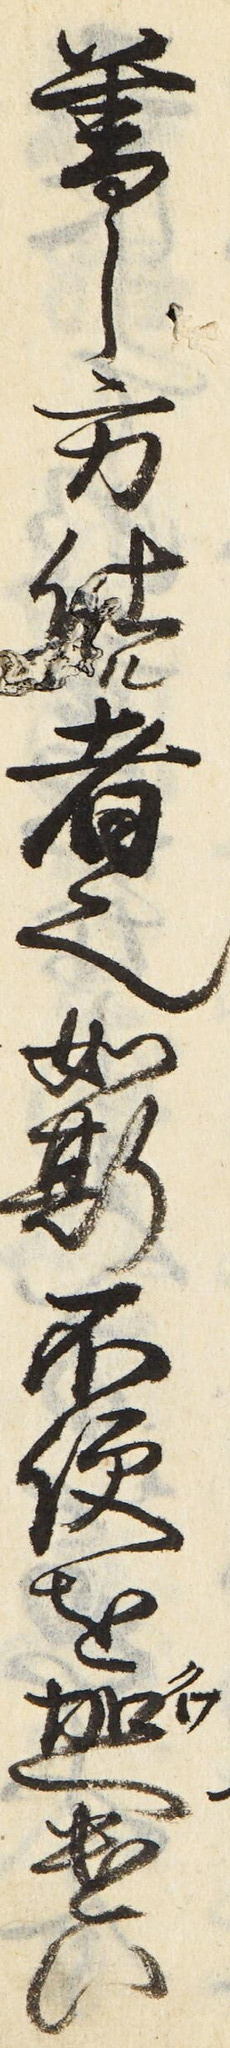暮し方仕る者也如斯不便を加へ遣ひ
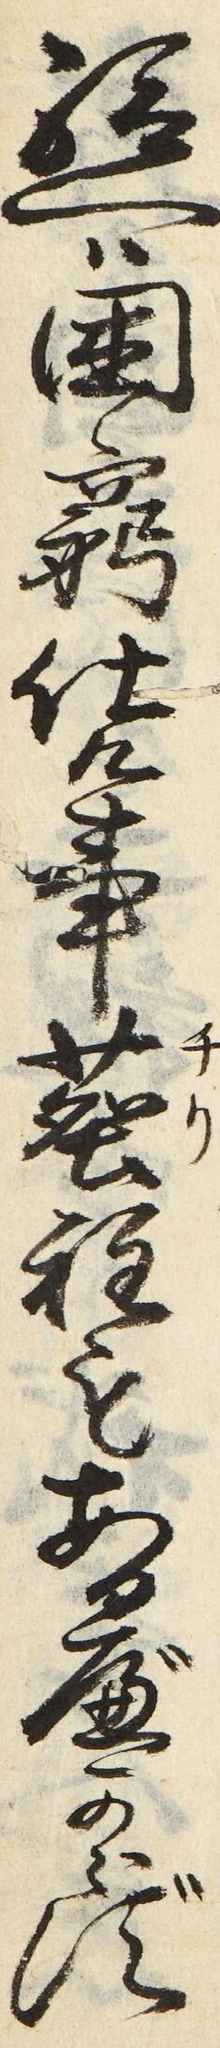給へは困窮仕る事塵程もあるべからず

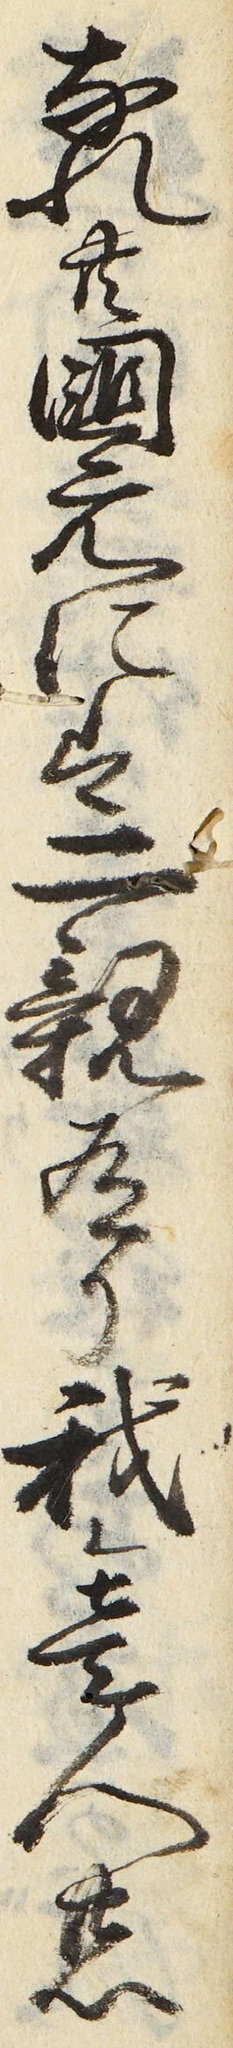なれ共国元には二親有り我れ壱人の
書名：華夷九年録
